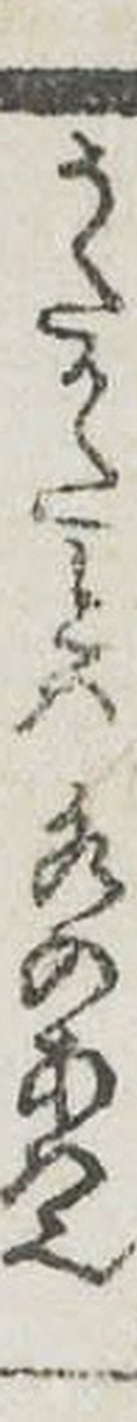うたかたとは水のあは也
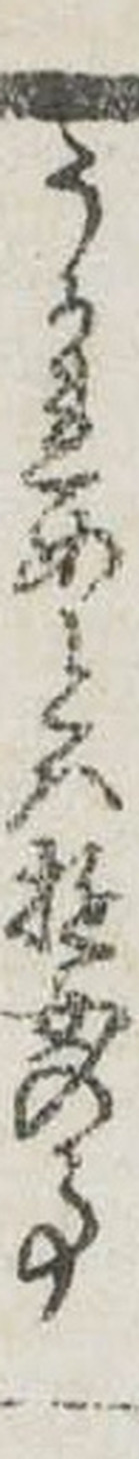うかれめとは遊女の事
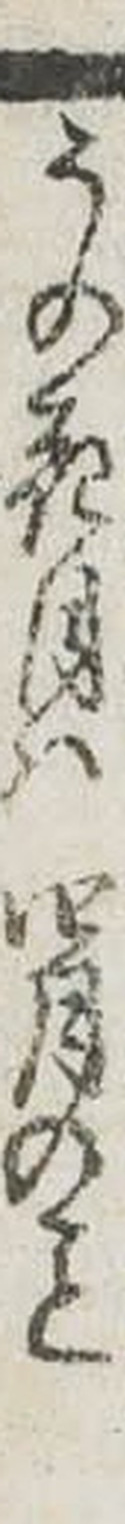うの花月は四月のこと
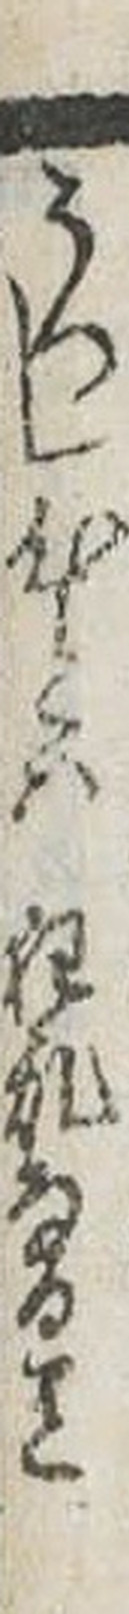うつし心とは狂乱なること
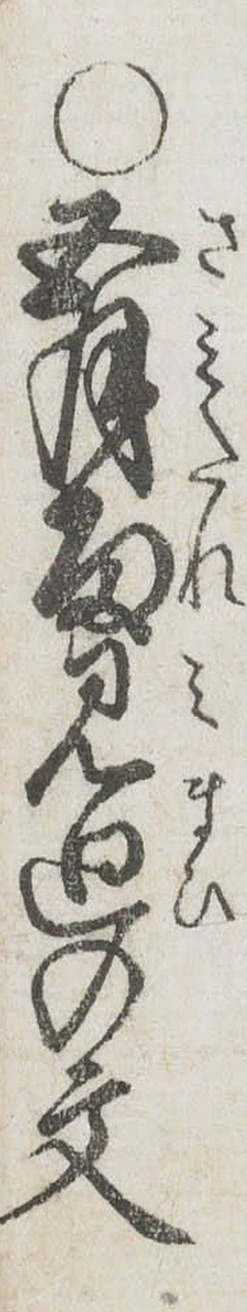○五月雨見廻の文
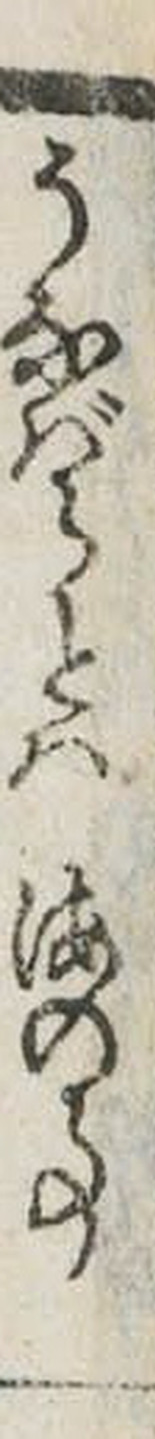うなばらとは海の事
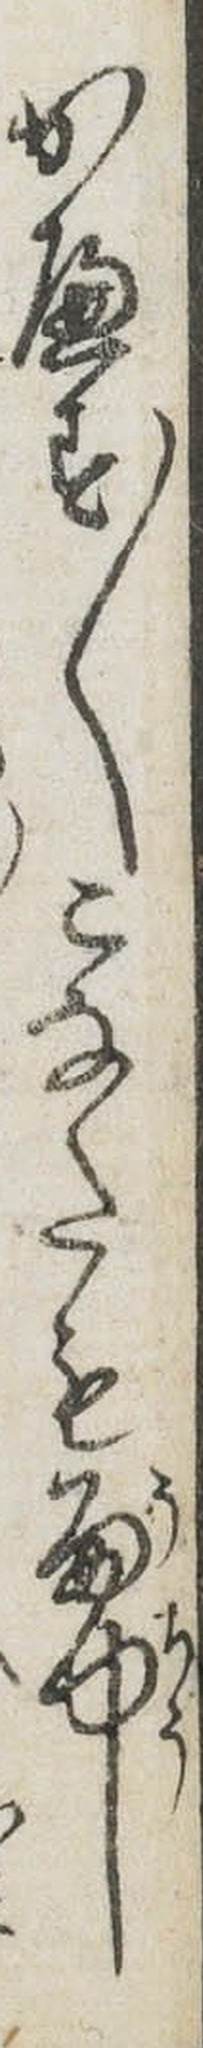かへす〳〵こなたも雨中
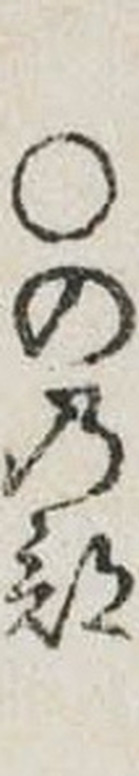○のの部
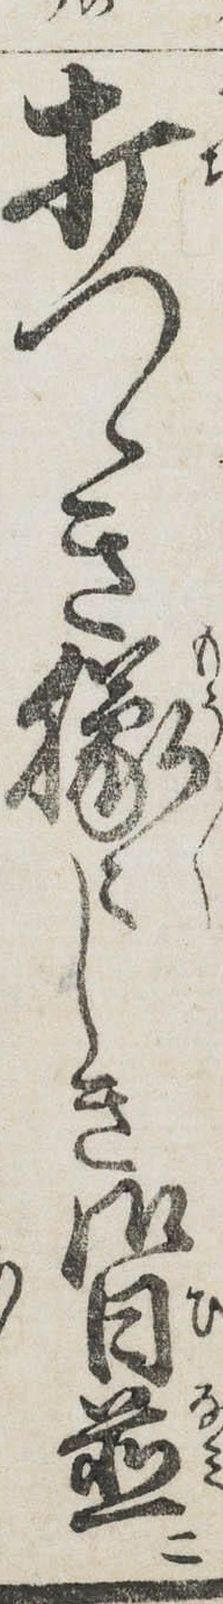打つゝき朦々しき御日並に
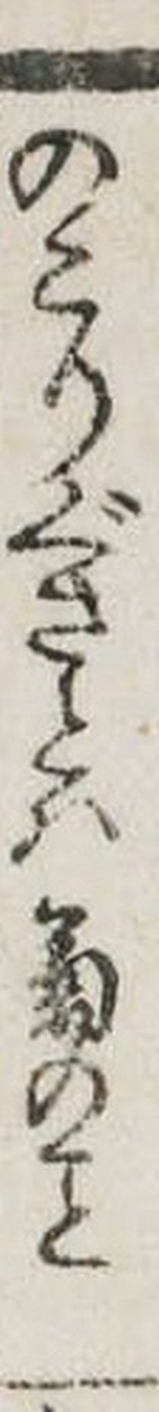のこりぐさとは菊のこと
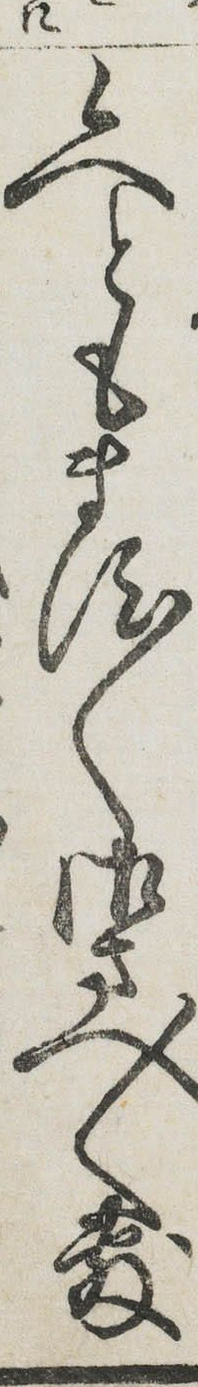候へともます〳〵御さへ〳〵敷
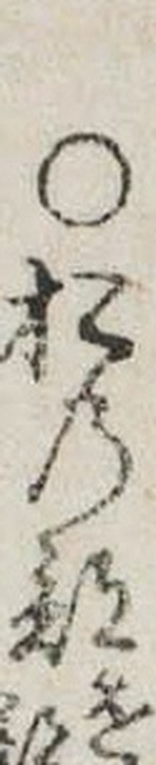○らの部
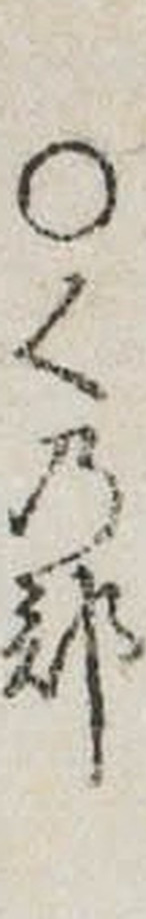○くの部
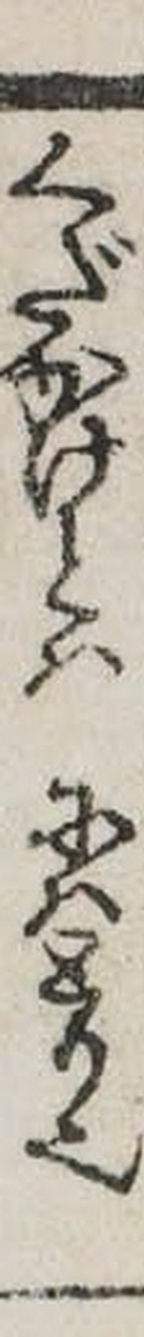くだかけとはにはとり也
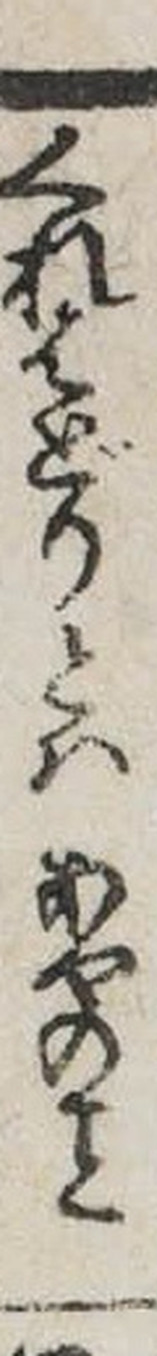くれはどりとはあやのこと
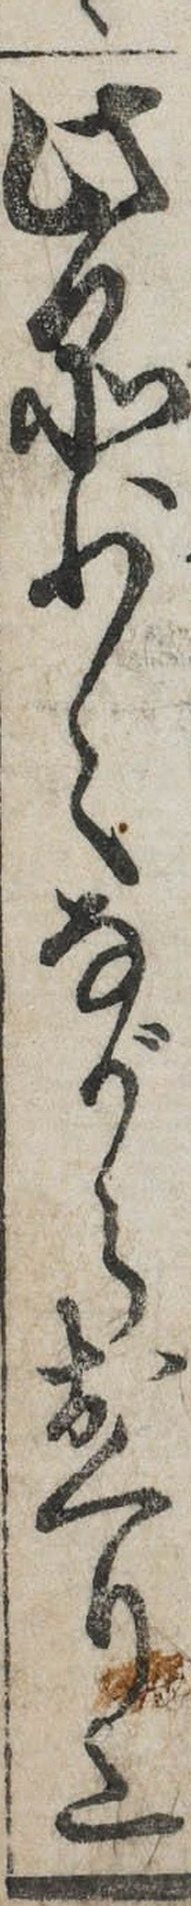此品少々ながらおくり上
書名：頭書萬用婦人手紙之文言
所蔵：東京学芸大学教育コンテンツアーカイブ
